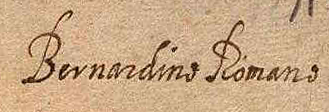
Bernardino Romano
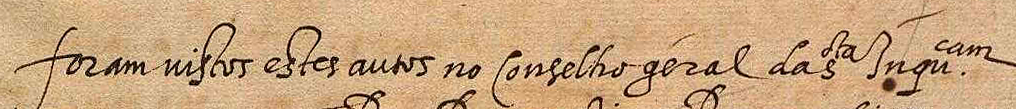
foram uistos estes autos no Conselho geral da sta Inqu.çam
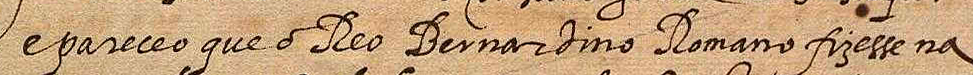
e pareceo que o Reo Bernardino Romano fizesse na
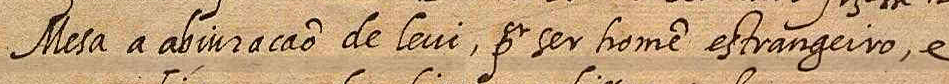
Mesa a abiuração de leui, por ser homē estrangeiro, e
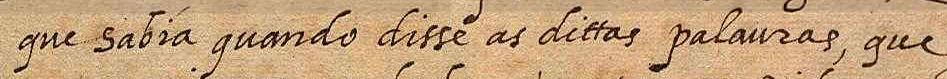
que sabia quando disse as dittas palauras, que
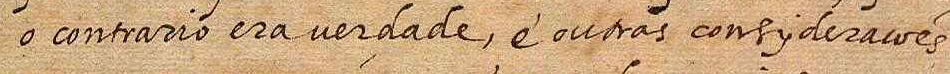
o contrario era uerdade, e outras consyderaçoẽs
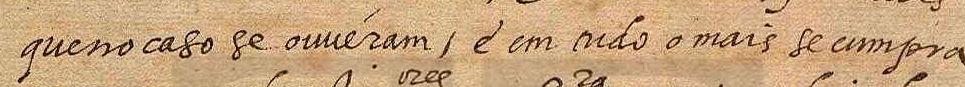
que no caso se ouueram / e em tudo o mais se cumpra
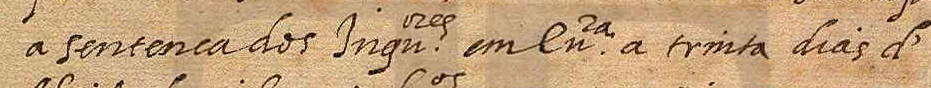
a sentença dos Inqu.ores Eur.a a trinta dias d'
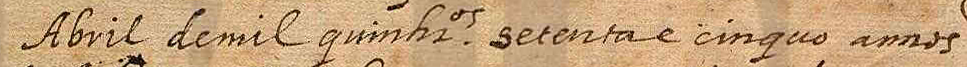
Abril de mil quinhtos. setenta e cinquo annos
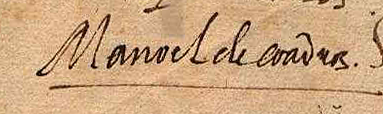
Manoel de coadros.
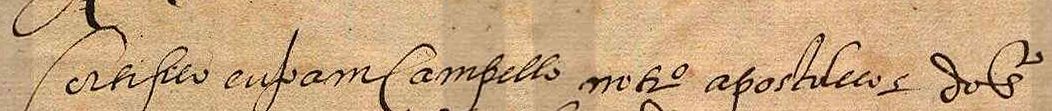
Certifico eu Joam Campello notro apostolico E do sto
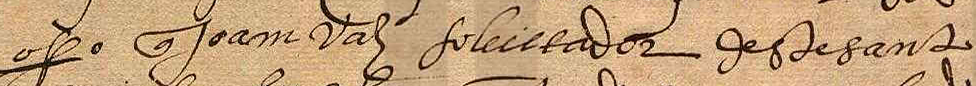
offo q̄ Joam Vaz solicitador deste santo
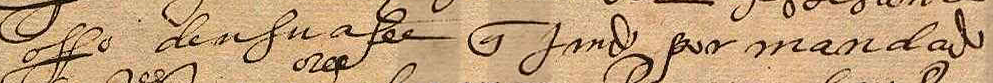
offo deu sua fee q̄ Jmdo por mandado
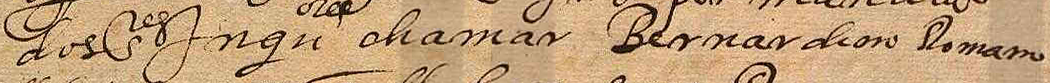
dos sres Jnquores chamar Bernardino Romano
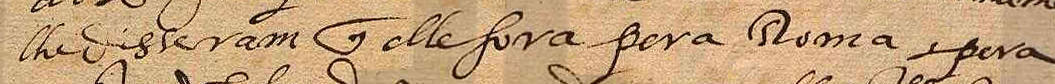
lhe disseram q̄ elle fora pera Roma e pera
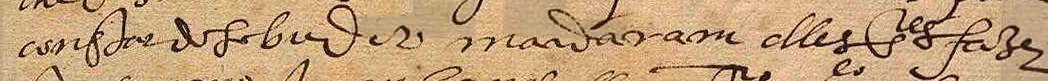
constar do sobredito mandaram elles sres fazer
